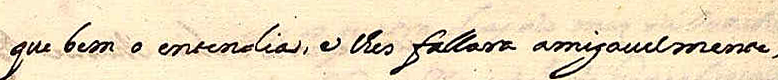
que bem o entendia, e lhes fallara amigauelmente,
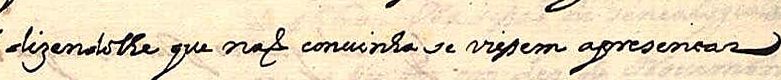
dizendolhe que naõ conuinha se viessem apresentar
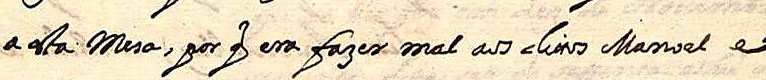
a esta Mesa, porq̄ era fazer mal aos dittos Manoel e
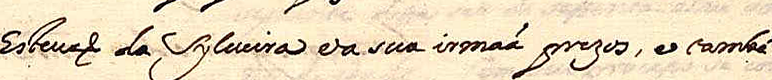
Esteuaõ da Sylueira e a sua irmaã prezos, e tambē
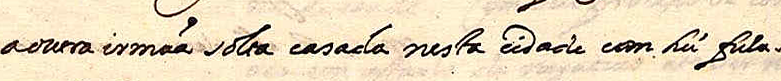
a outra irmaā solta casada nesta cidade com hū fula
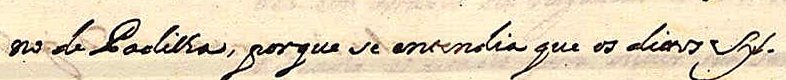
no de Padilha, porque se entendia que os dittos Syl
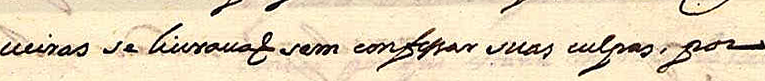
ueiras se liurauaõ sem confessar suas culpas, por
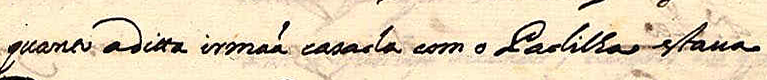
quanto a ditta irmaã casada com o Padilha estaua
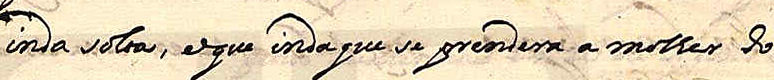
inda solta, e que inda que se prendera a molher do
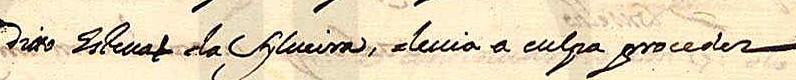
ditto Esteuaõ da Sylueira, deuia a culpa proceder
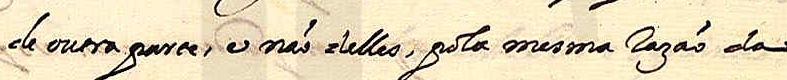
de outra parte, e naõ delles, pola mesma Razaõ da
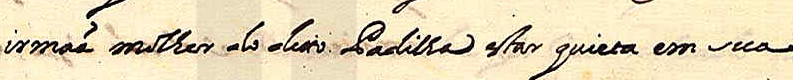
irmaã molher do ditto Padilha estar quieta em sua
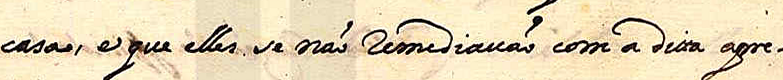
casa, e que elles se naõ Remediauaõ com a ditta apre
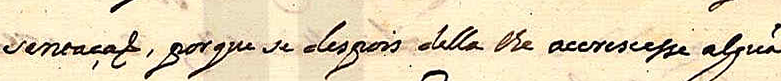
sentaçaõ, porque se despois della lhe accrescesse alguā
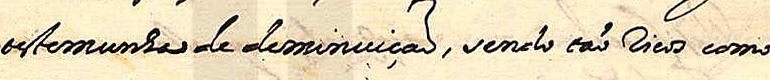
testemunha de deminuiçaõ, sendo taõ Ricos como
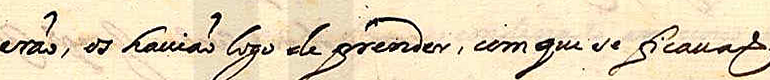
eraõ, os hauiaõ logo de prender, com que se ficauaõ
